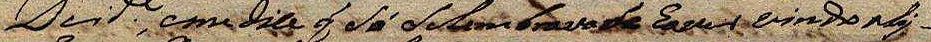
De id.e, e me dice q̄ só se lembrava de haver vindo aly
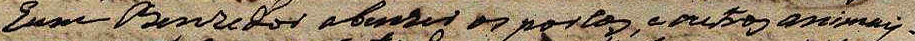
hum Benzedor a benzer os porcos, e outros animais
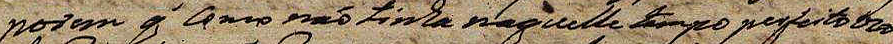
porem q̄ como naõ tinha naquelle tempo perfeito uzo
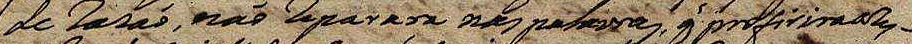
de Rasaõ, naõ Reparara nas palavras, q̄ profirira a Res
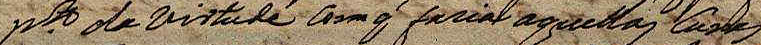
p.to da virtude com q̄ fazia aquellas Curas.
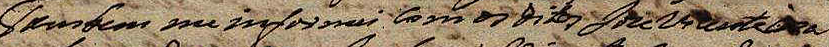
Tambem me informei com os ditos Joze Vicente _a
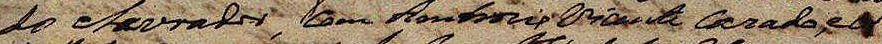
do e lavrador , com Antonio Vicente cazado, e _
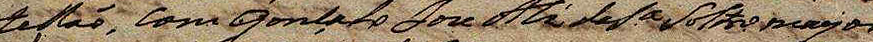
telhaõ, com Gonçalo Joze Alz̄ da S.a soltr.o mayor
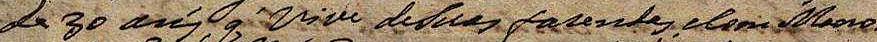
de 30 ans̄, q̄ vive de Suas fazendas e com Mano
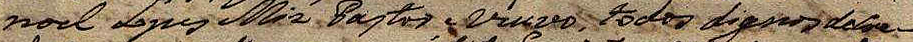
noel Lopes Miz̄ Pastor e viuvo, todos dignos de cre
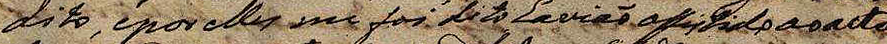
dito, e por elles me foi dito haviaõ assistido ao acto
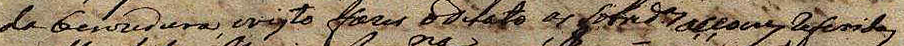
da benzedura, e visto fazer o Delato as sobrd.as aççoens Referidas
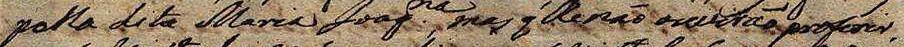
polla dita Maria Joaq.na, mas q̄ lhe naõ ouuiraõ proferir,
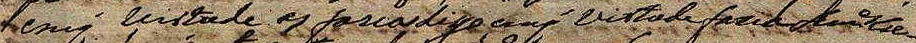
em q̄ virtude as fazia digo, em q̄ virtude fazia semes cu
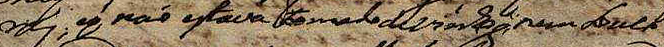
ras; e q̄ naõ estava tomado de vinho, nem Louco.
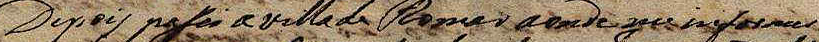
Depois passei a villa de Thomar aonde me informei
